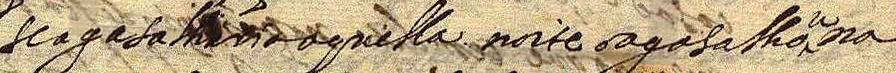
se agasalharia aquella noite o agasalhou na
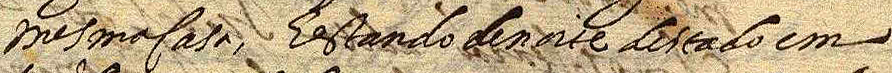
mesma Casa, E estando de noite deitado em
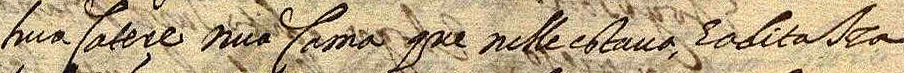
huā Catere nuā Cama que nelle estaua, E a dita Iza
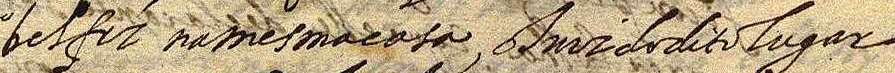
bel frz̄ na mesma casa, o Iuiz do dito lugar
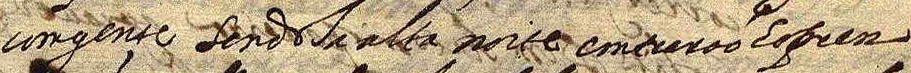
com gente sendo Ia alta noite entraraõ Eo pren
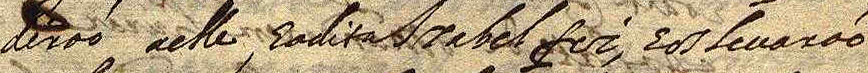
derāo a elle, E a dita Izabel frz̄, E os leuaraõ
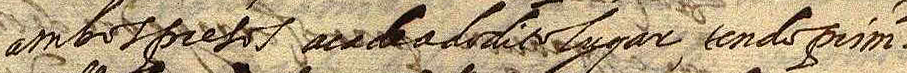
ambos presos a cadea do dito lugar, tendo prim.ro
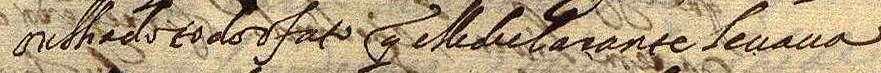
oulhado todo o fato q̄ elle declarante leuaua
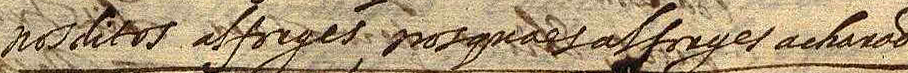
nos ditos alforges, nos quaes alforges acharaõ
